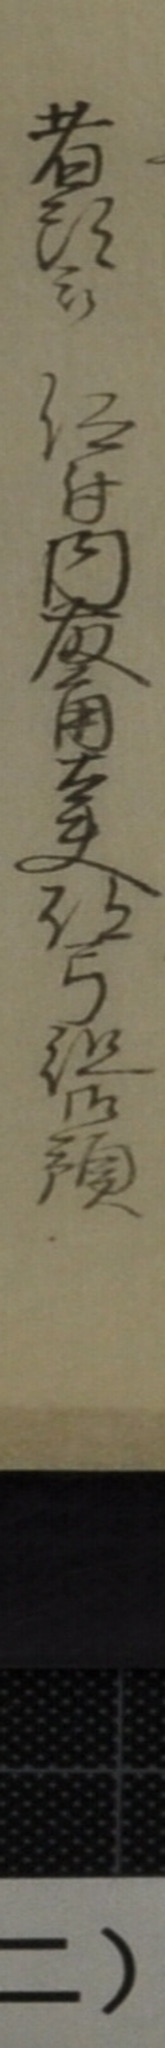者頭被仰付内藤角太夫跡弓組御預
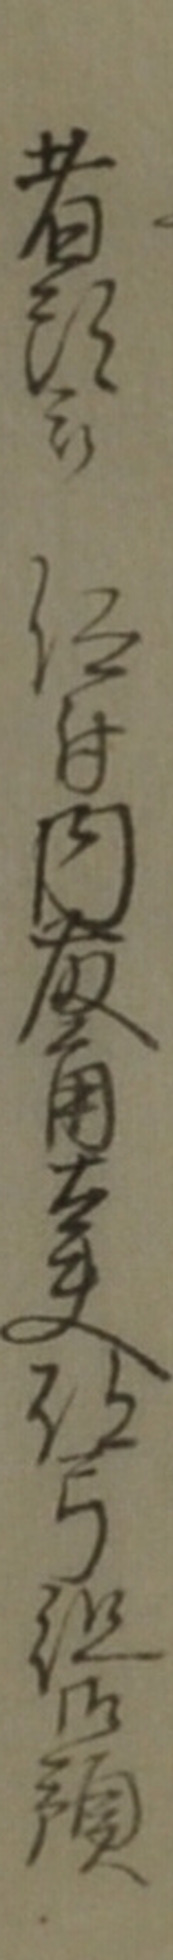者頭被仰付内藤角太夫跡弓組御預
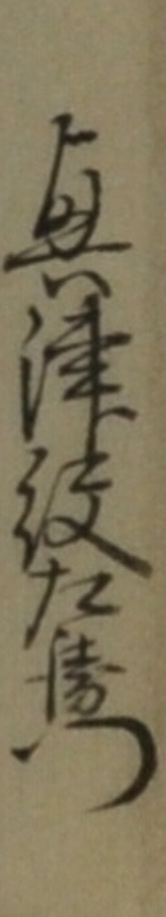奥津紋左衛門
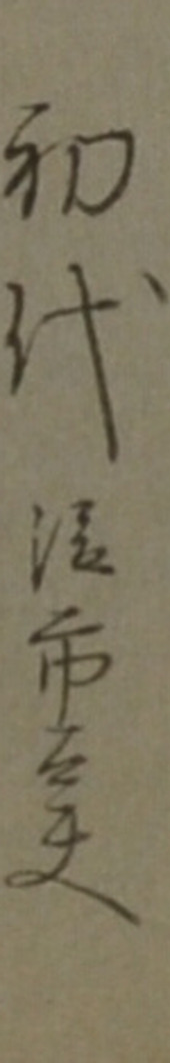初代後市太夫
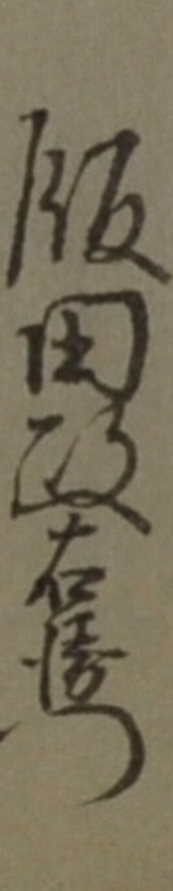飯田政右衛門
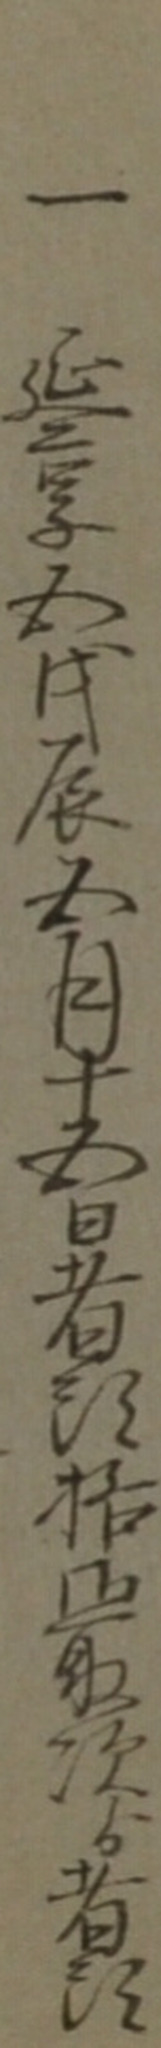一延享五戊辰五月十五日者頭格御取次ゟ者頭
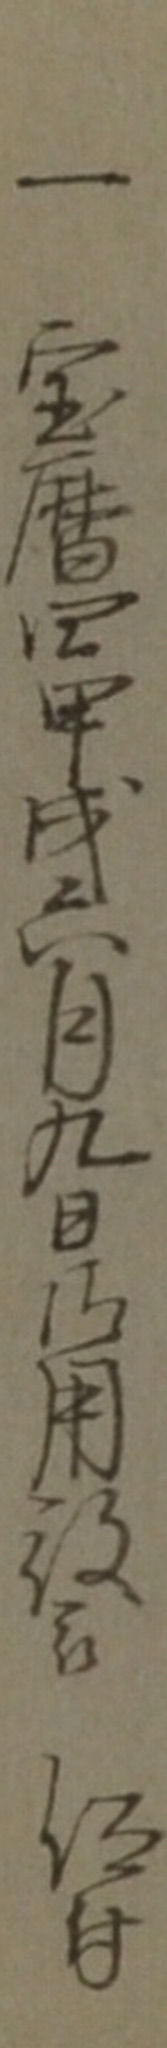一宝暦四甲戌六月九日御用役被仰付
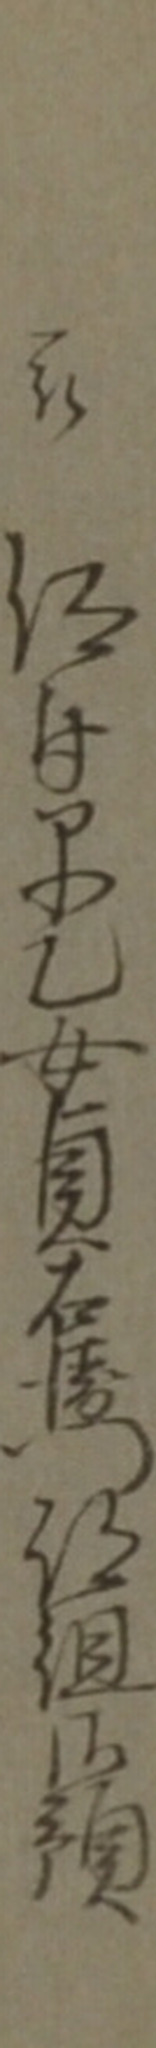被仰付早乙女貞右衛門跡組御預
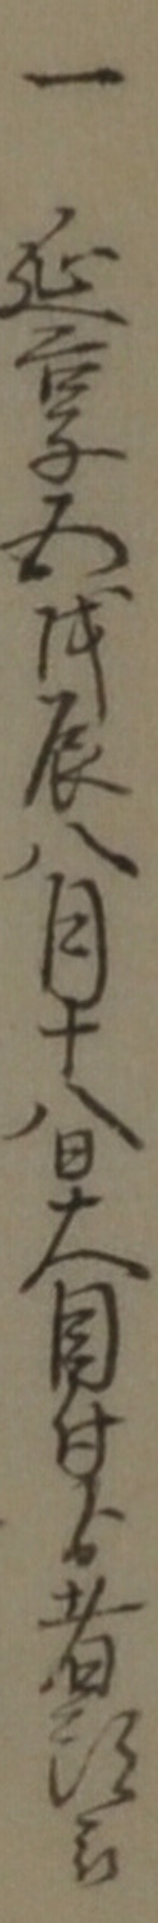一延享五戊辰八月十八日大目付ゟ者頭被
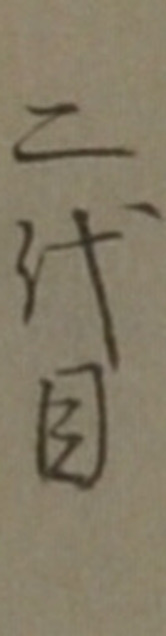二代目
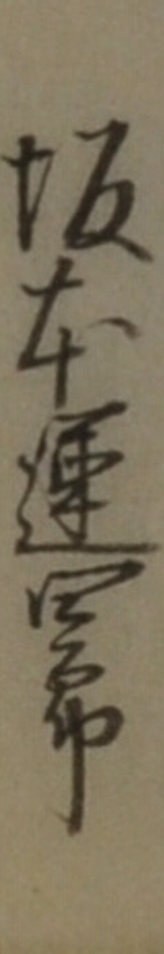坂本運四郎
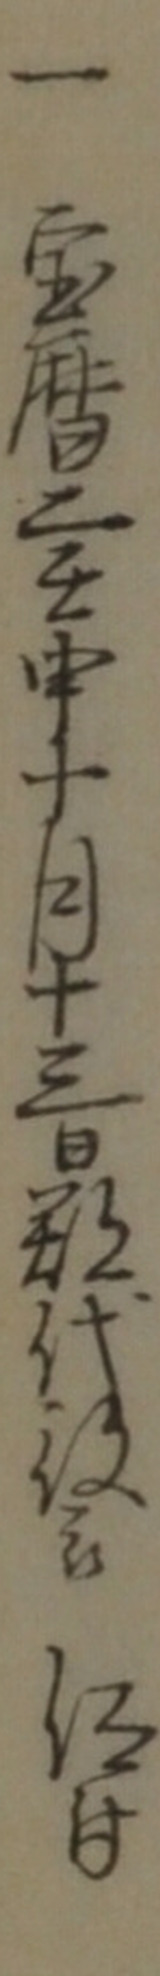一宝暦二壬申十月十三日郡代役被仰付
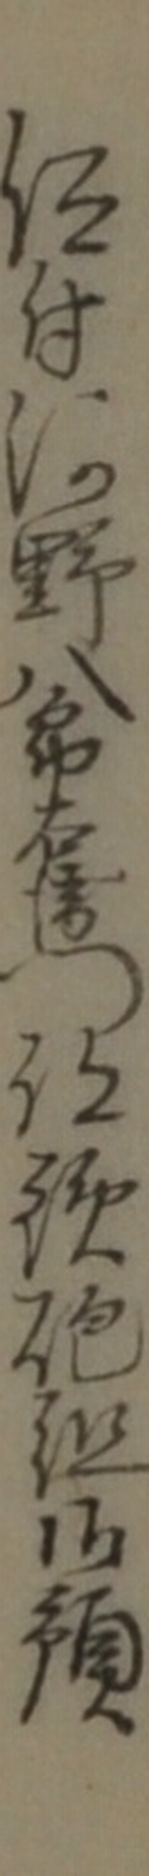仰付河野八郎右衛門跡鉄砲組御預
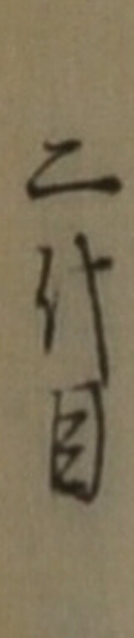二代目
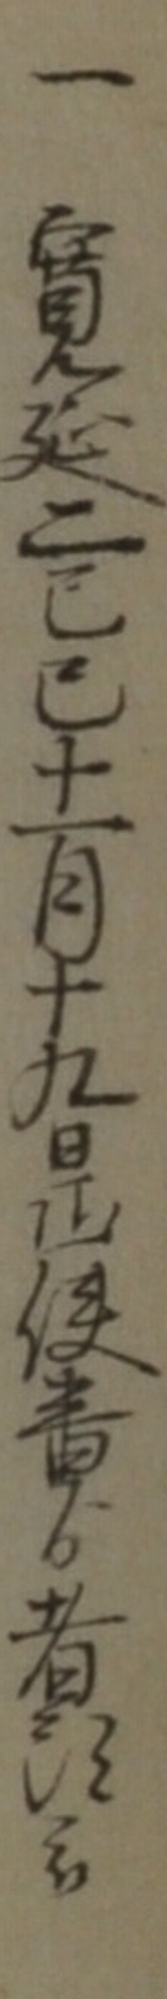一寛延二己巳十一月十九日御使番ゟ者頭被
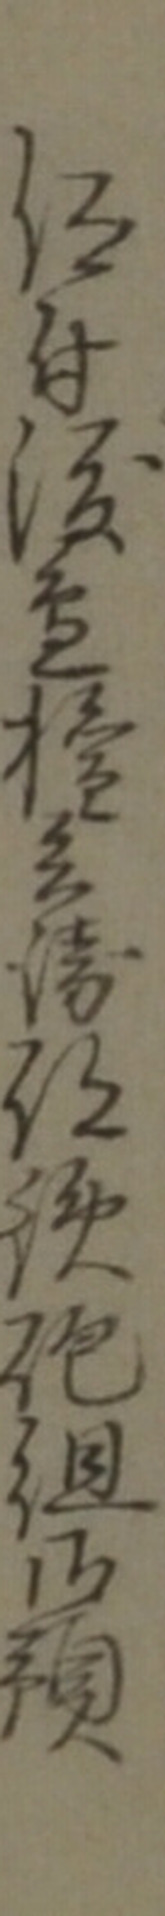仰付渡辺権兵衛跡鉄砲組御預
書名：諸御役代々録（二）
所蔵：伊那市立高遠町図書館・合同会社AMANE
